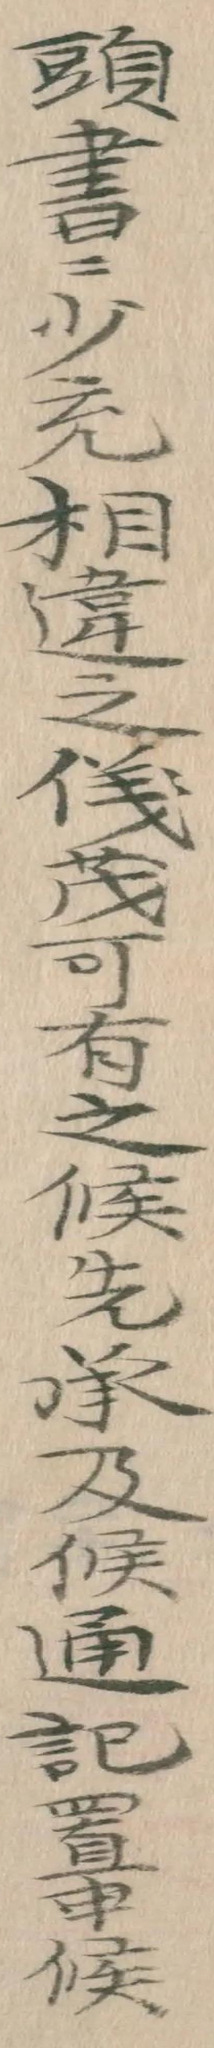頭書ニ少充相違之儀モ可有之候先承及候通記置申候
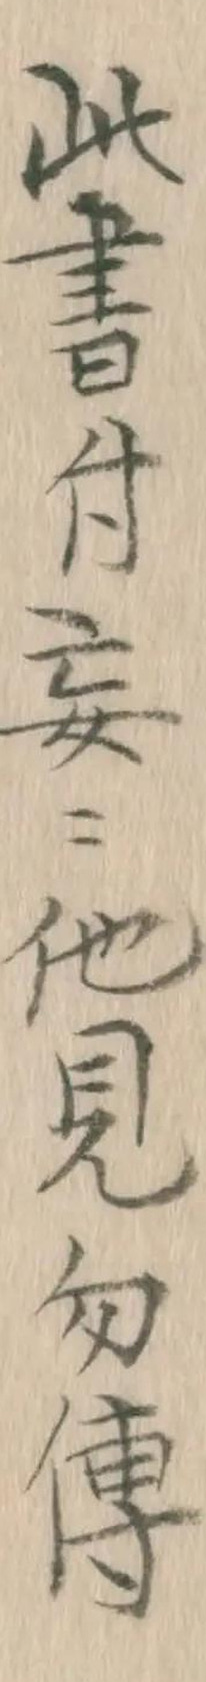此書付妄ニ他見勿伝
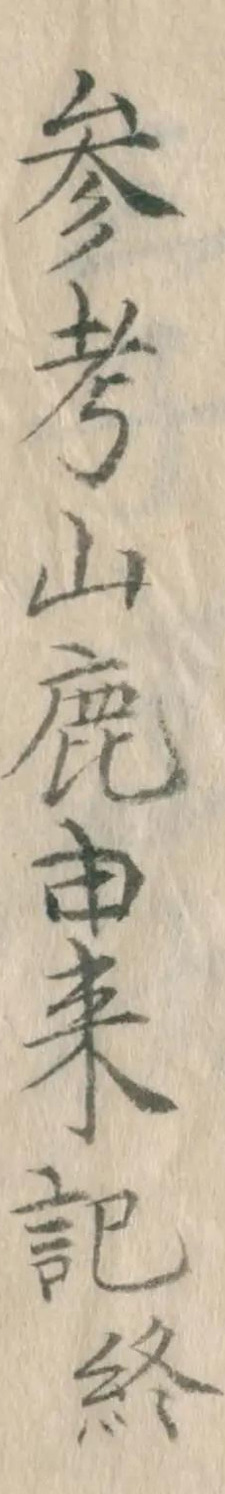参考山鹿由来記終

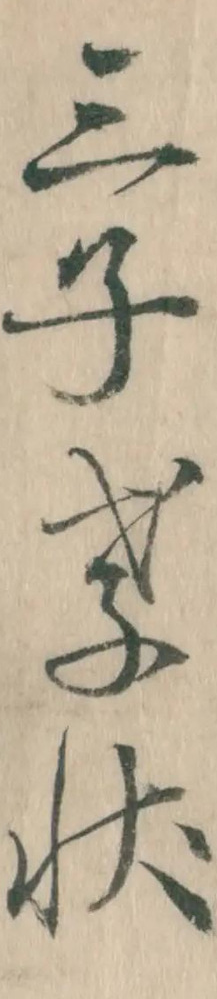三子孝状

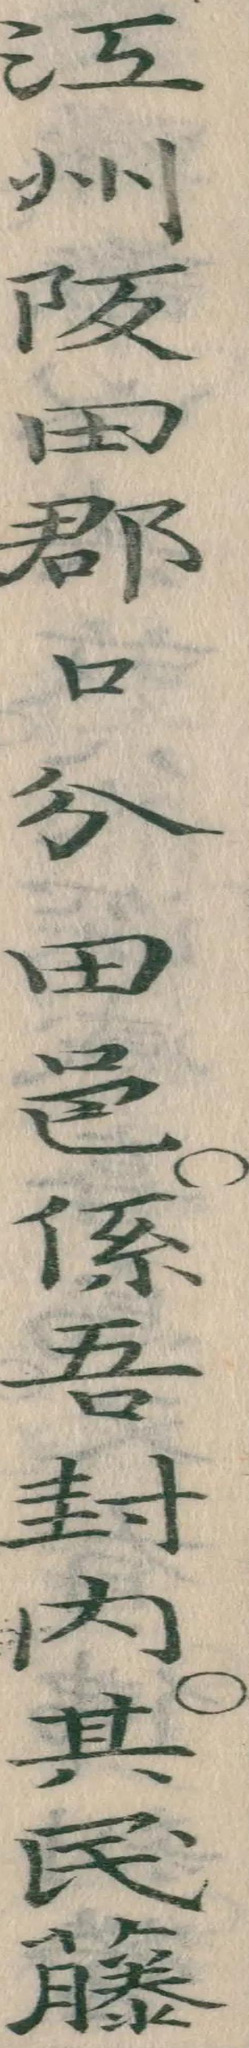江州阪田郡口分田邑。係吾封内。其民藤
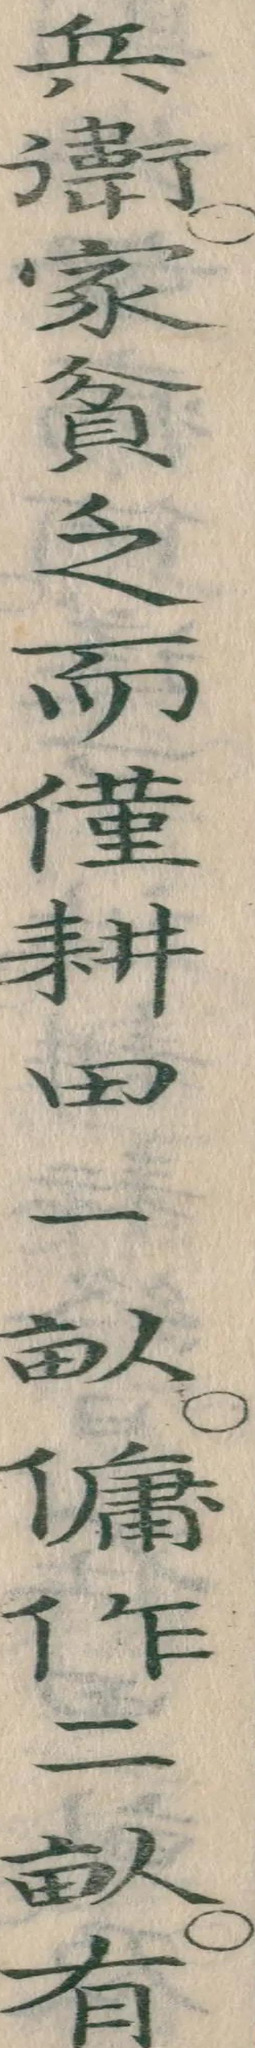兵衛。家貧乏而僅耕田一畝。傭作二畝。有
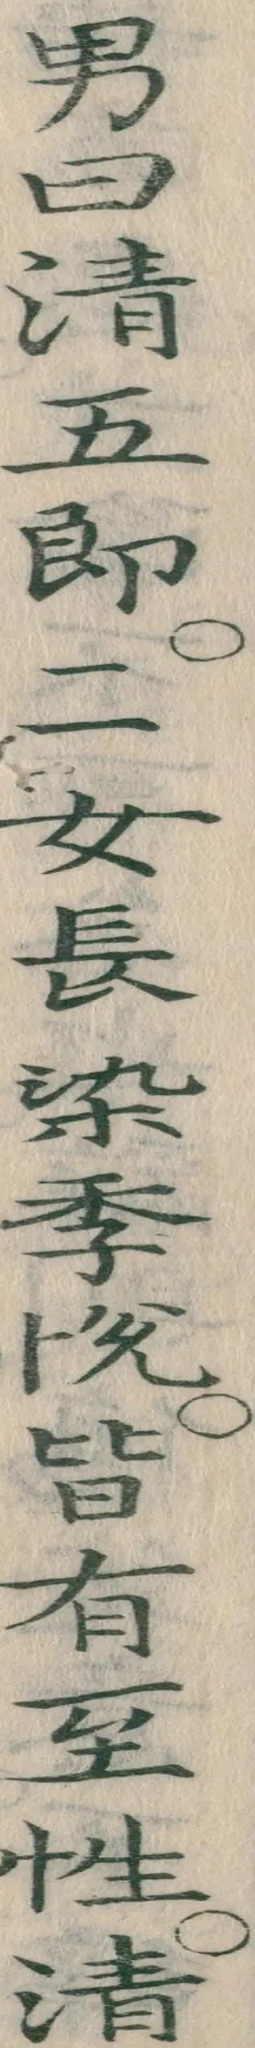男曰清五郎。二女長染季悦。皆有至性。清
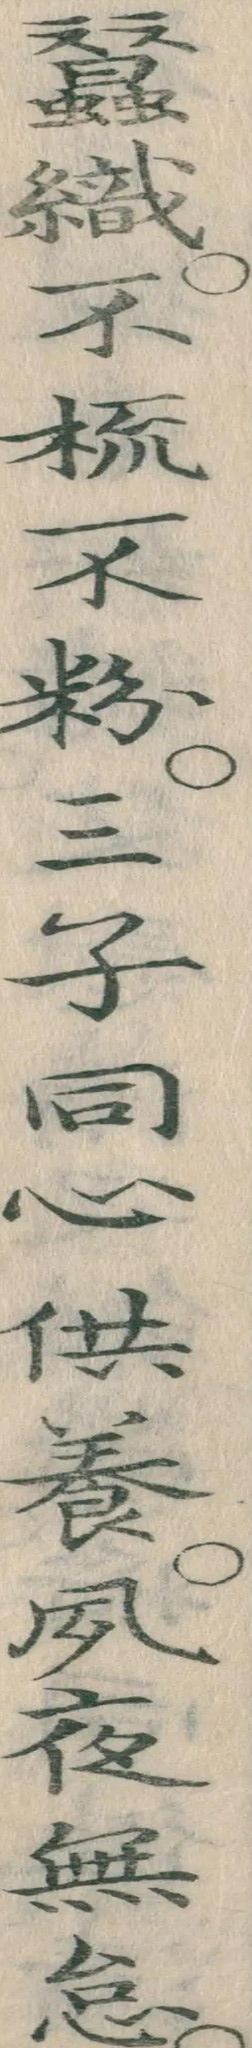蚕織。不梳不粉。三子同心供養。夙夜無怠。
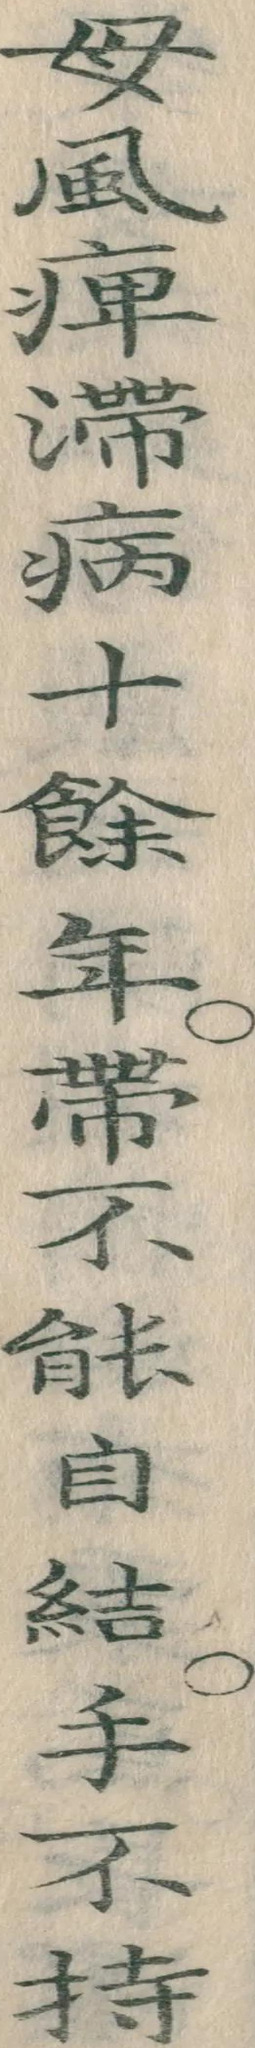母風痺滞病十余年。帯不能自結。手不持
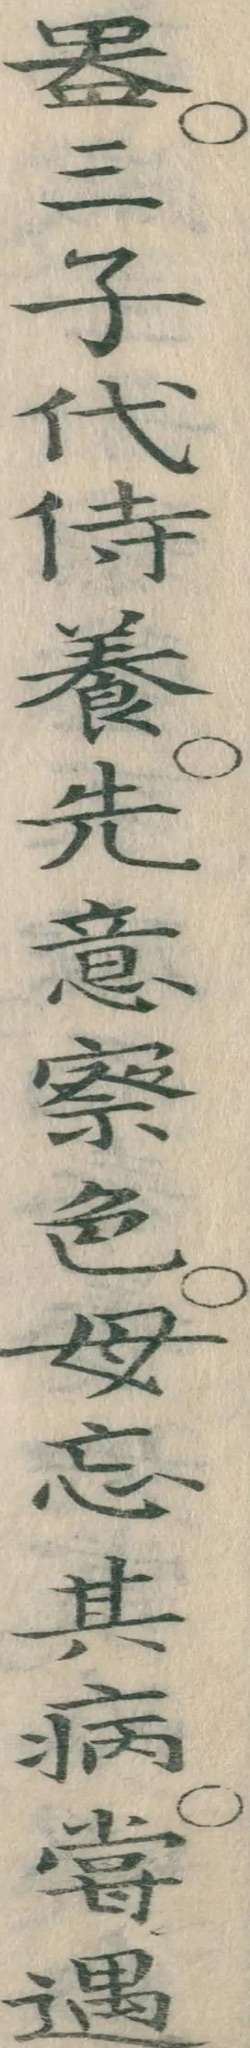器。三子代侍養。先意察色。母忘其病。嘗遇

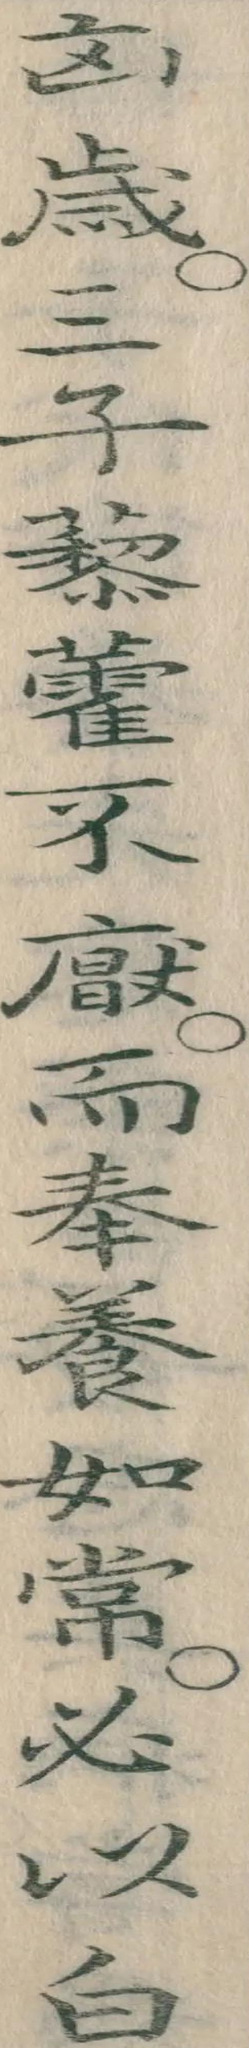歳。三子藜藿不厭。而奉養如常。必以白
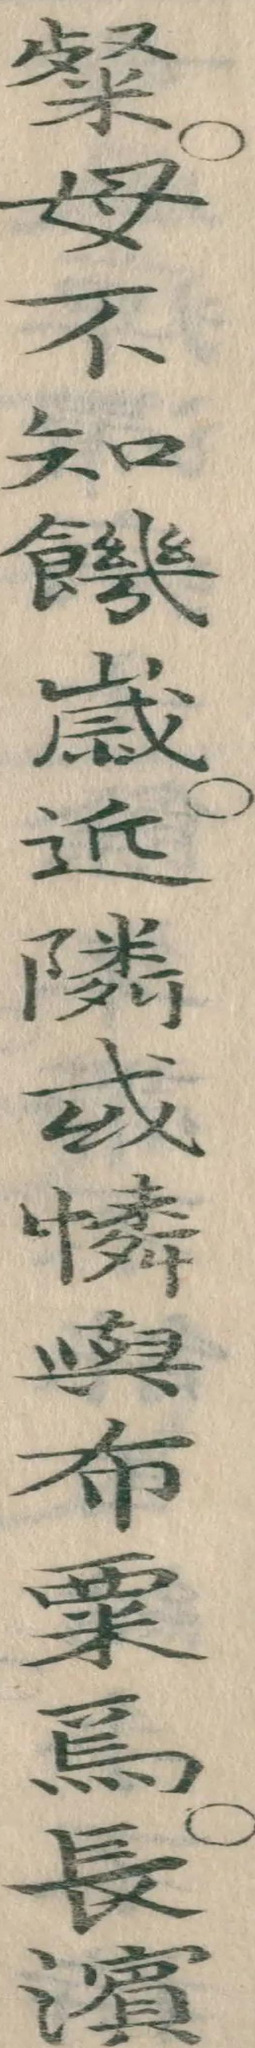粲。母不知饑歳。近隣或憐与布粟焉。長浜
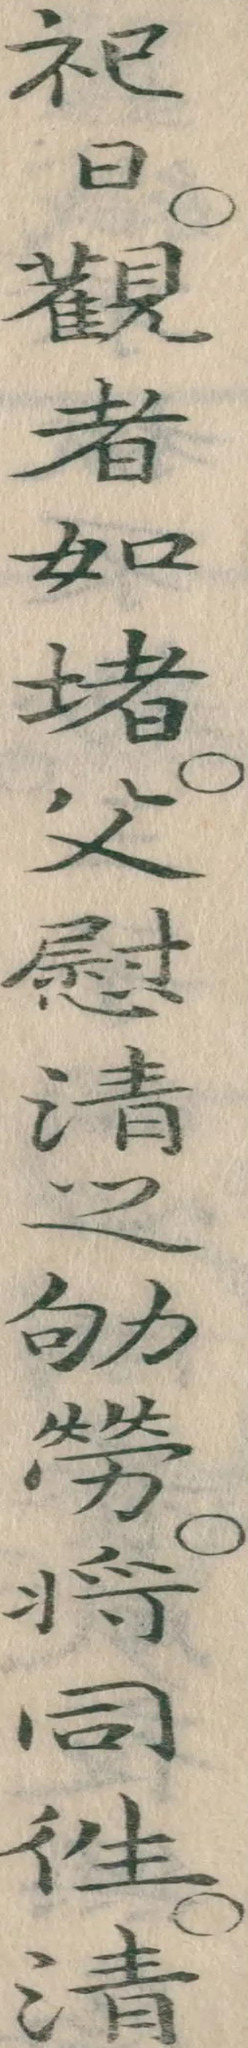祀日。観者如堵。父慰清之劬労。将同往。清
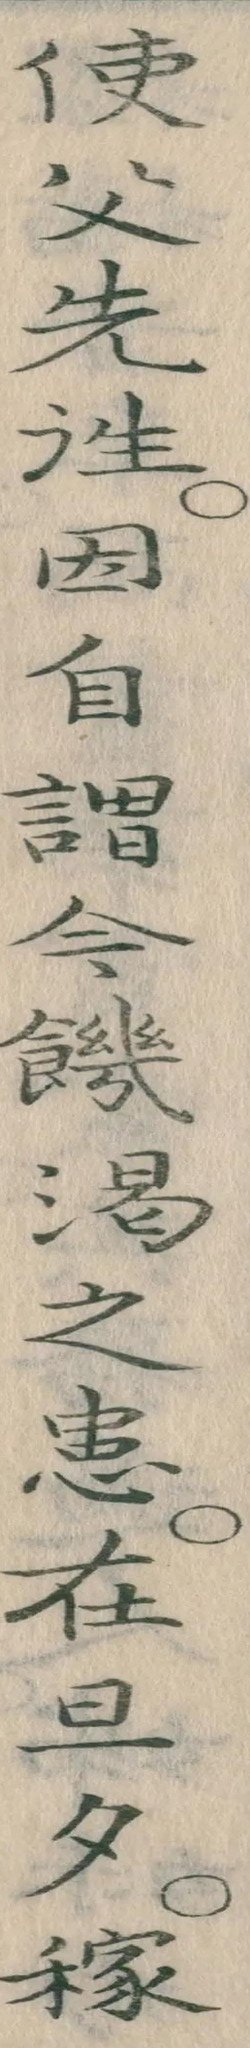使父先往。因自謂今饑渇之患。在旦夕。稼
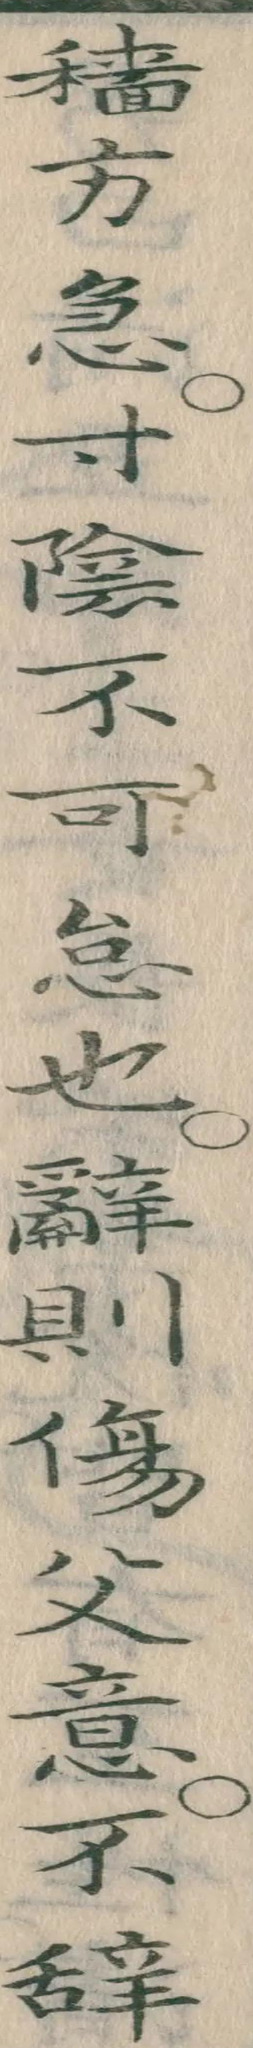穡方急。寸陰不可怠也。辞則傷父意。不辞
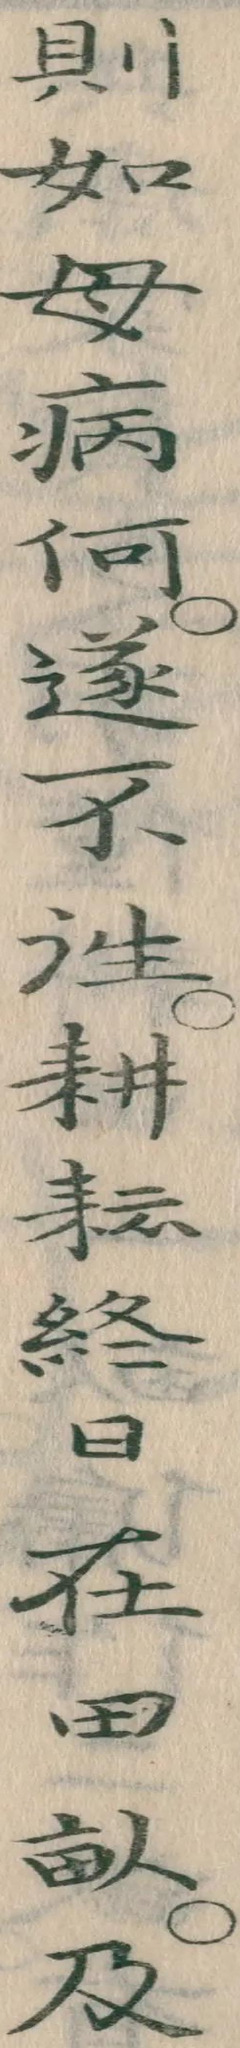則如母病何。遂不往。耕耘終日在田畝。及
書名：輪池叢書. 12
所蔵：国立国会図書館 National Diet Library, JAPAN
